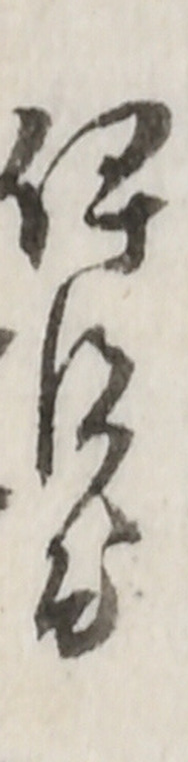伊沢村

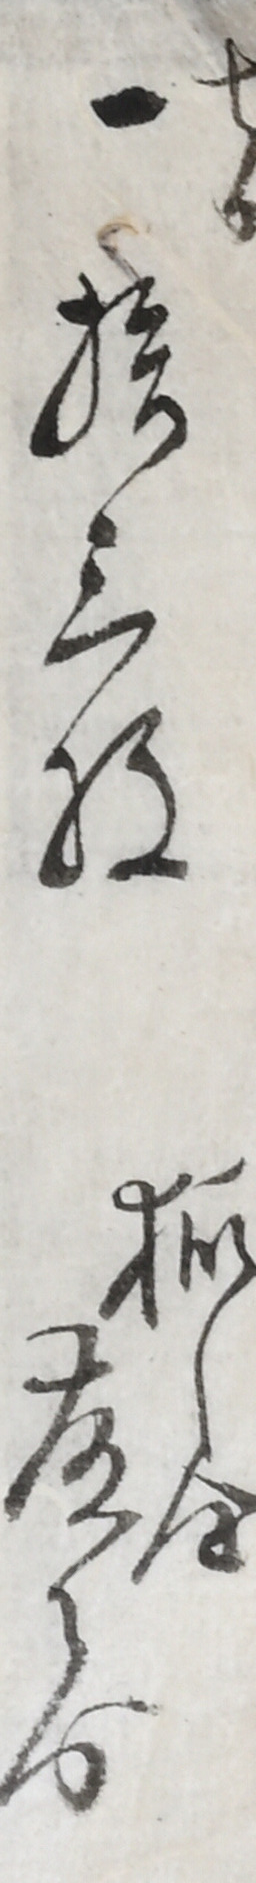一拾三枚藤右衛門
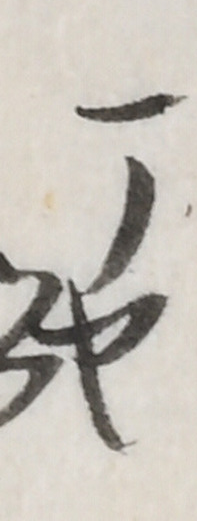一ノや
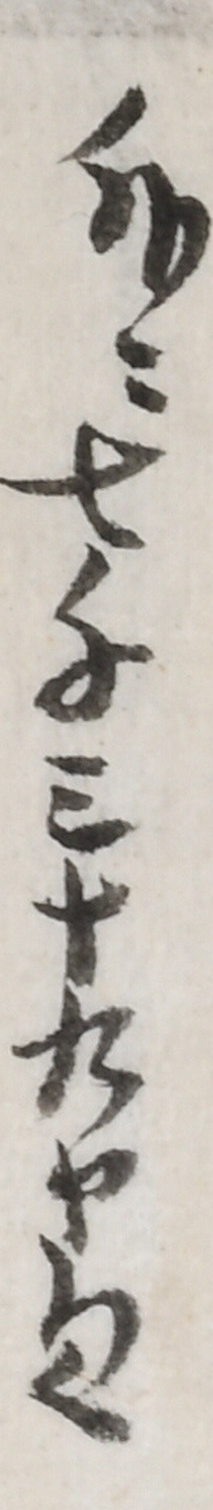外ニ七千三十九番
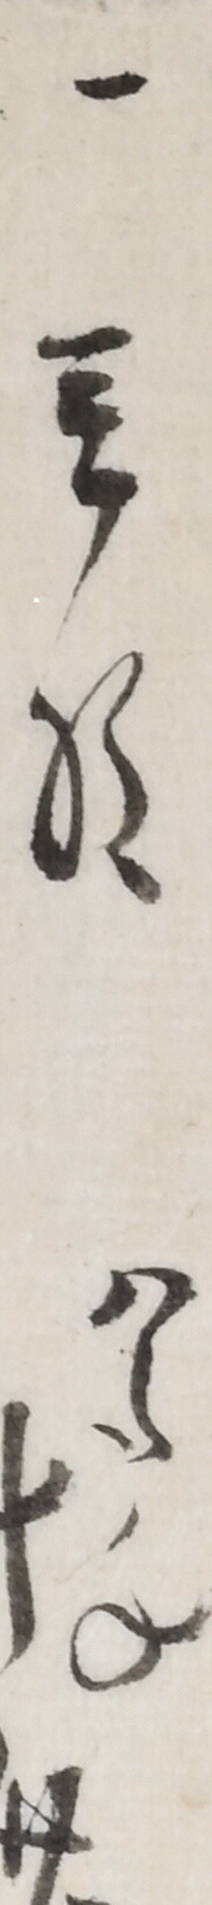一壱枚十介
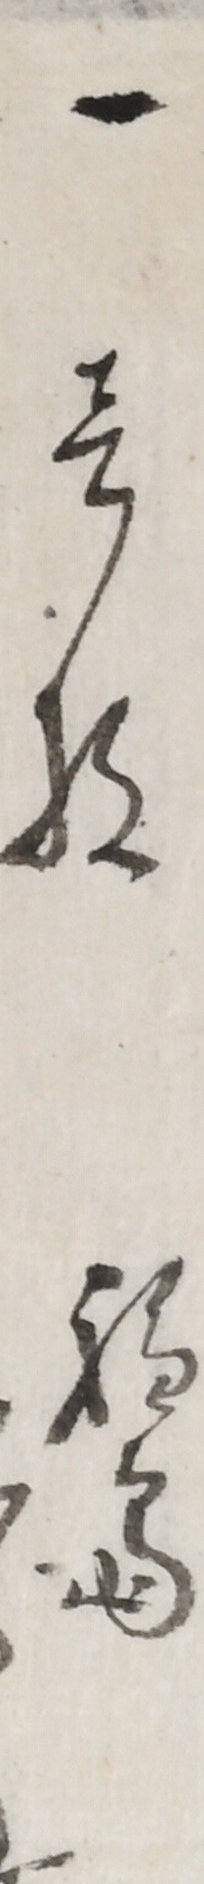一壱枚十介
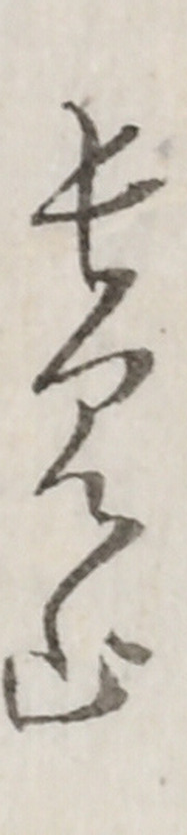長見山
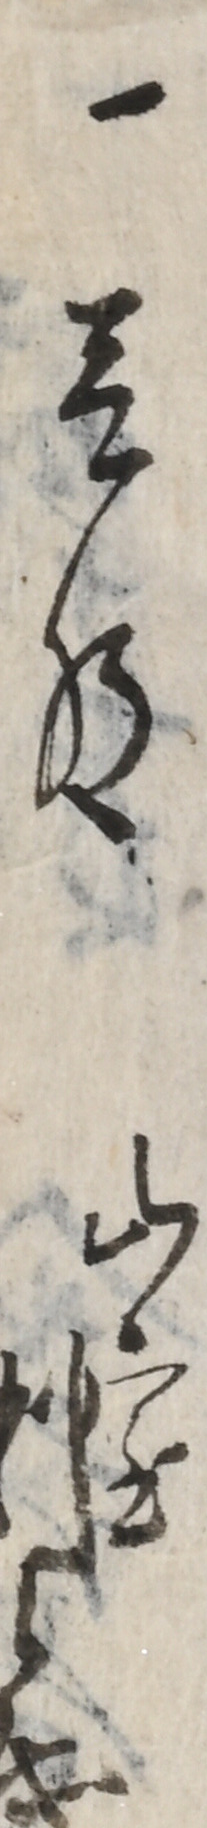一壱枚十介

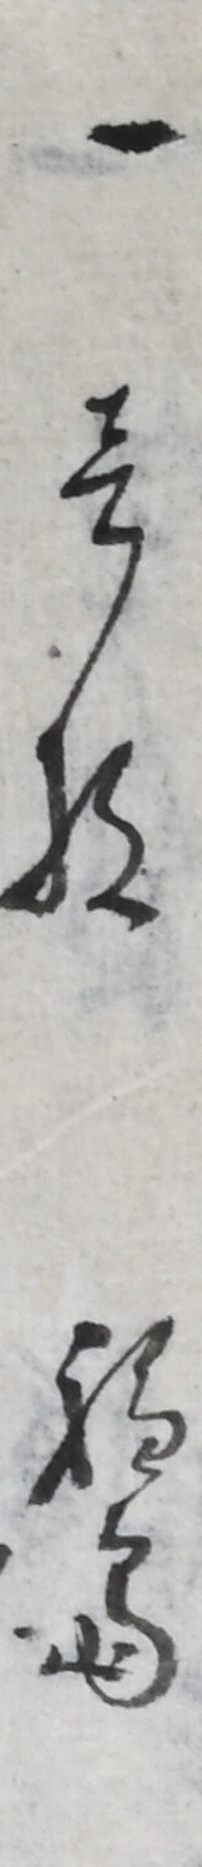一壱枚ノ一
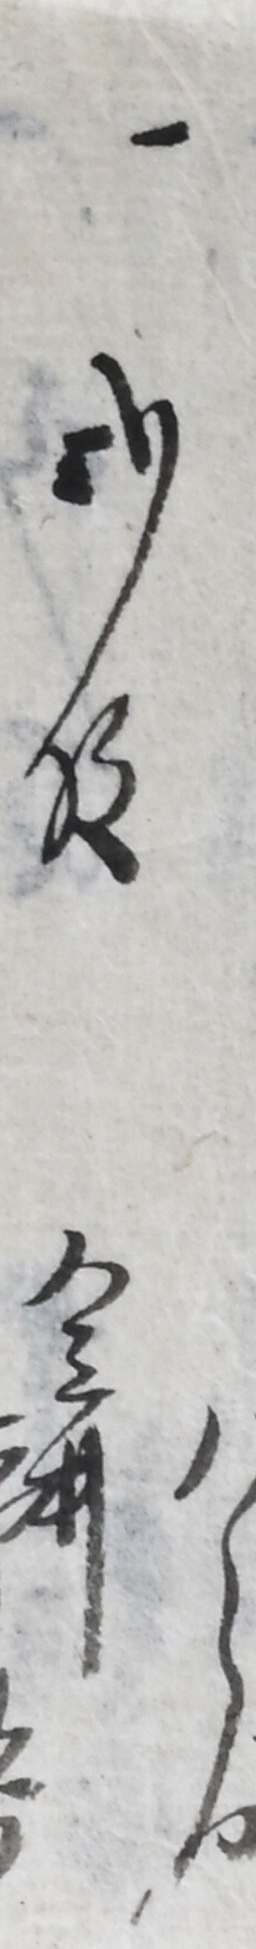一弐枚同人
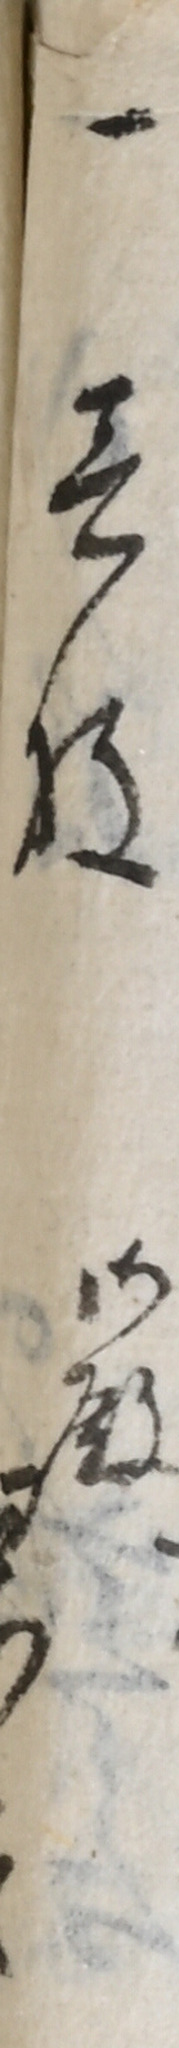一壱枚ノ一
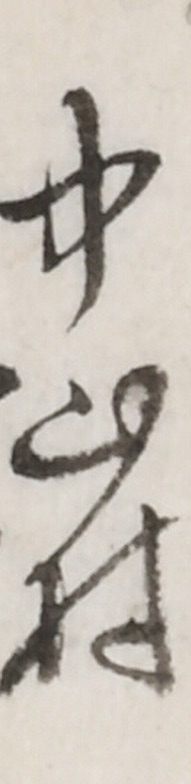中山村
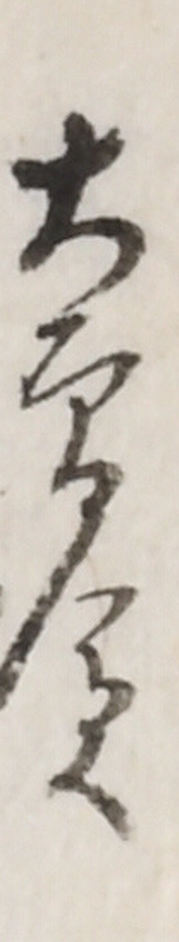大曽倉
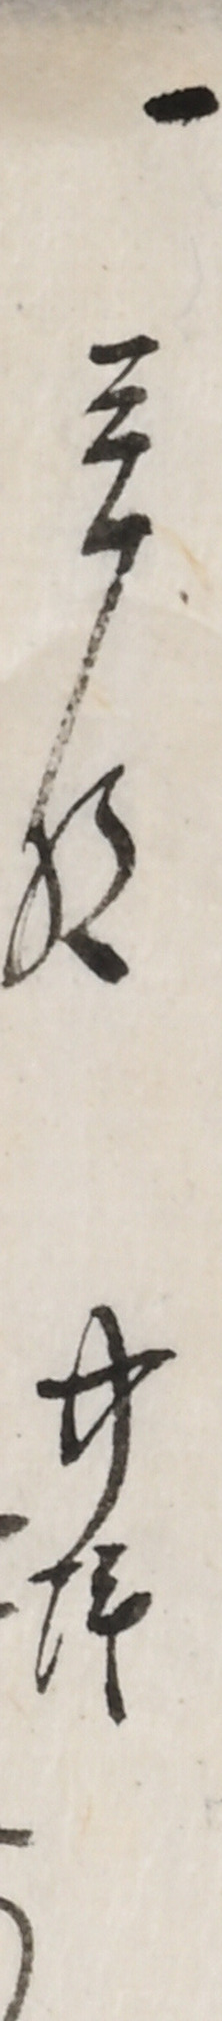一壱枚ノ一
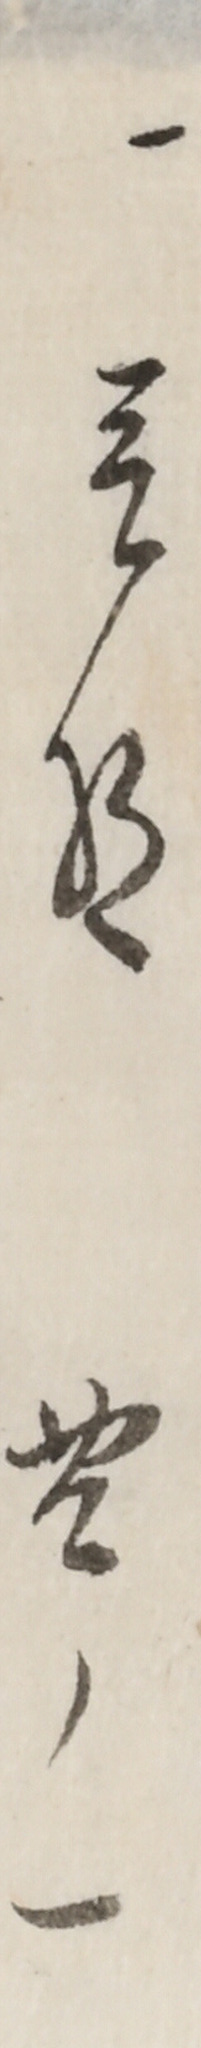一壱枚ノ一
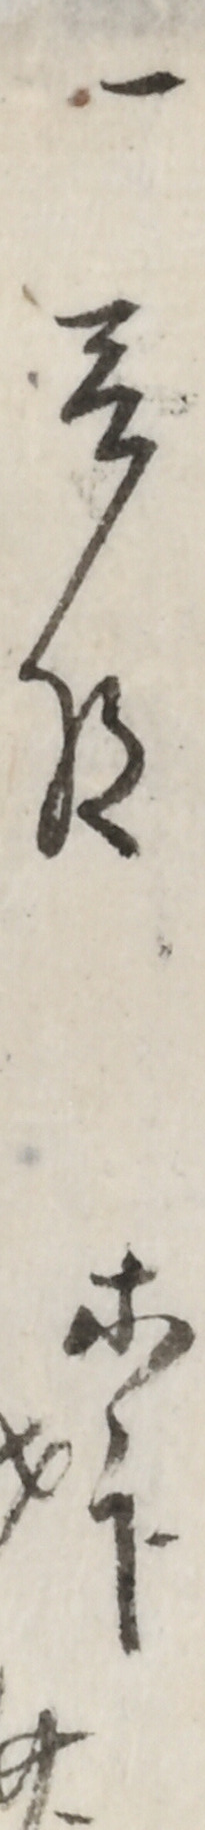一壱枚ノ一
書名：髙遠限楮幣引換覚帳
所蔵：伊那市立高遠町図書館・合同会社AMANE
